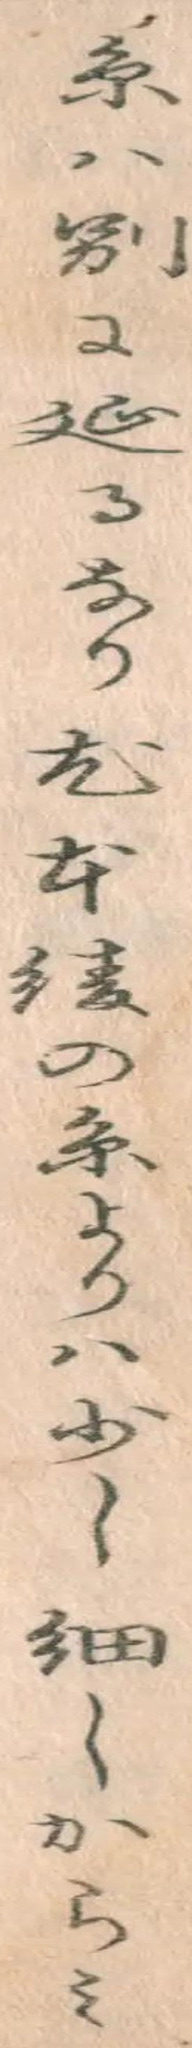糸は別に延るなり尤本綾の糸よりは少し細しからみ
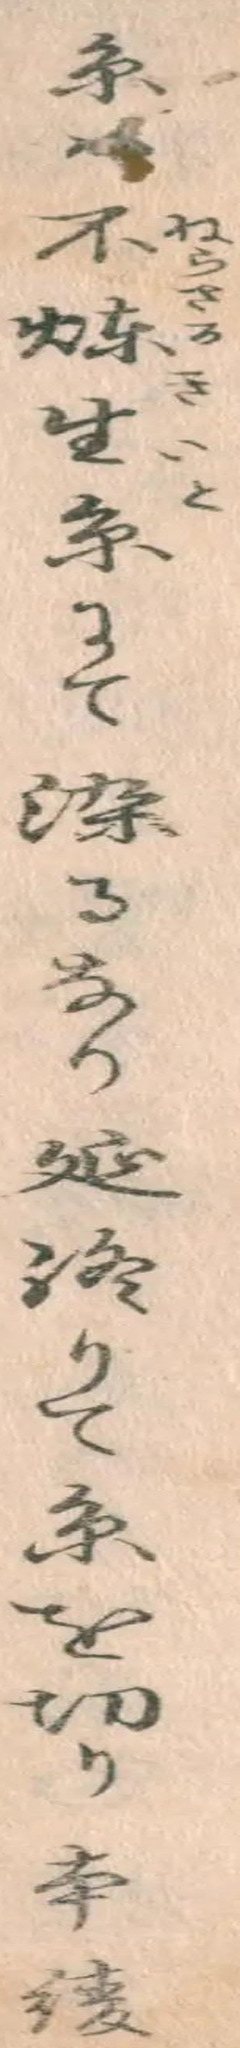糸は不煉生糸にて染るなり延終りて糸を切り本綾
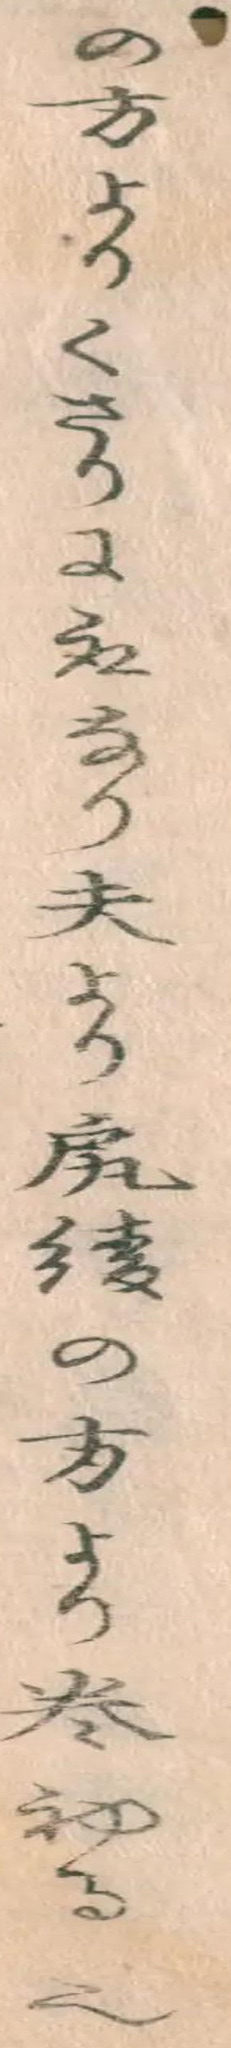の方よりくさりに取なり夫より尻綾の方より巻初る也
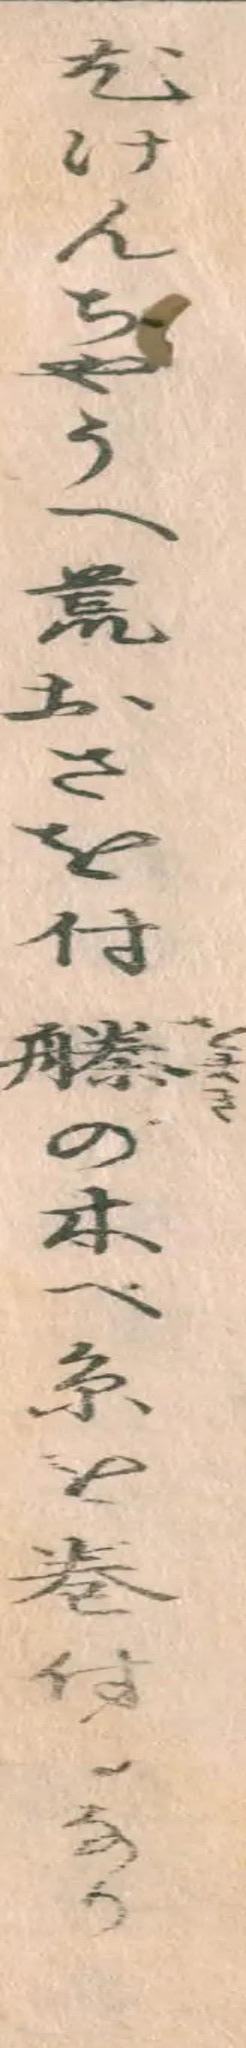尤けんちやうへ荒おさを付𣚗の木へ糸を巻付るなり
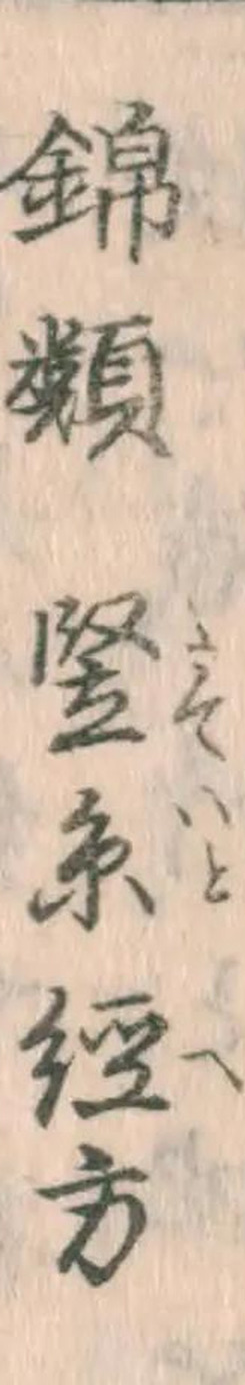錦類竪糸経方
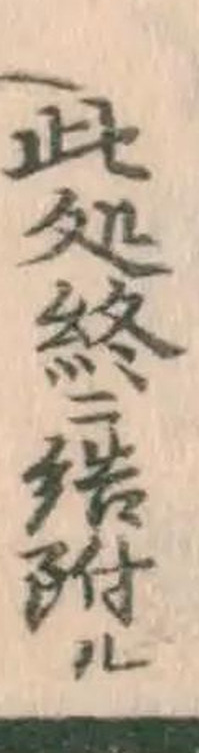此処終ニ結附ル

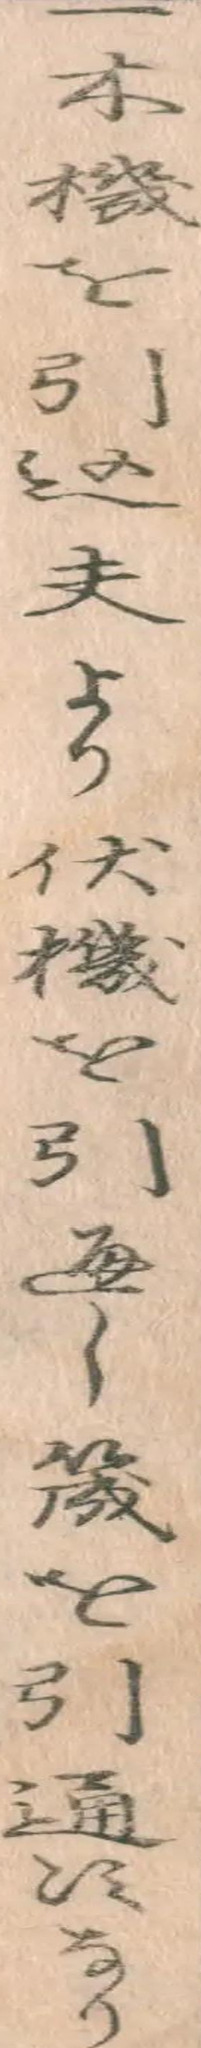一木機を引込夫より伏機を引通し筬を引通すなり
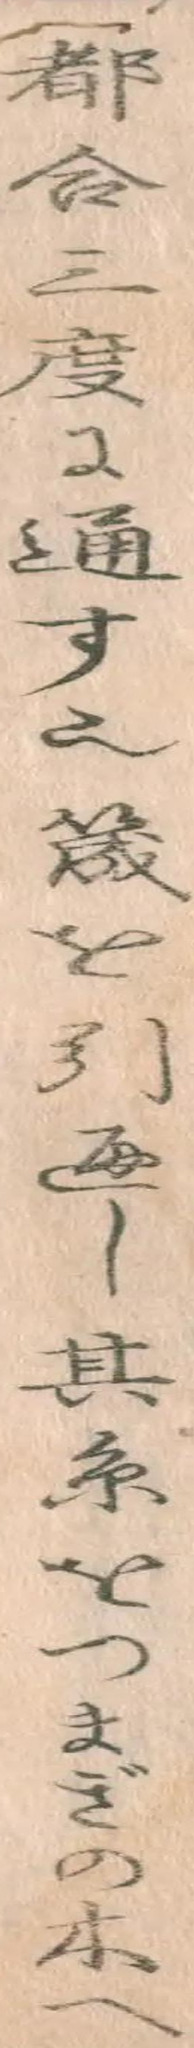都合三度に通す也筬を引通し其糸をつまぎの木へ
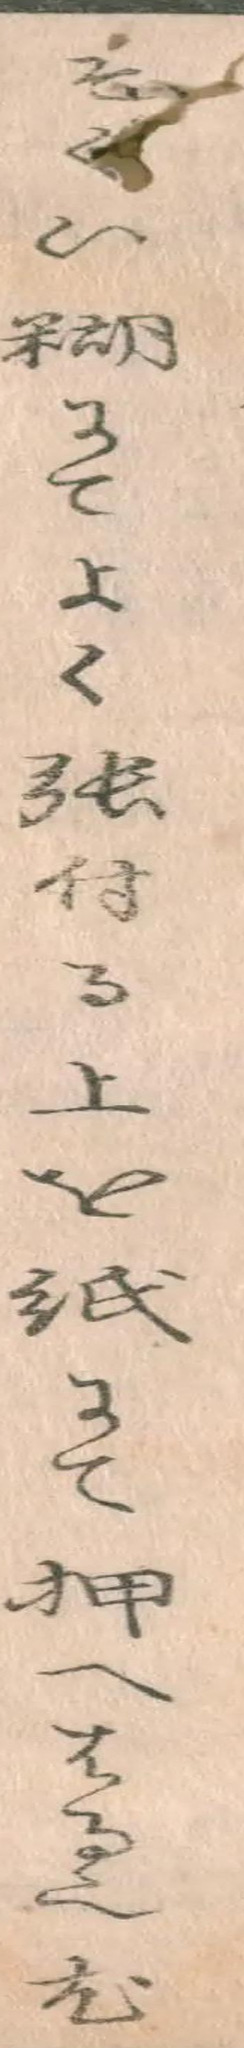そくい糊にてよく張付る上を紙にて押へはる也尤
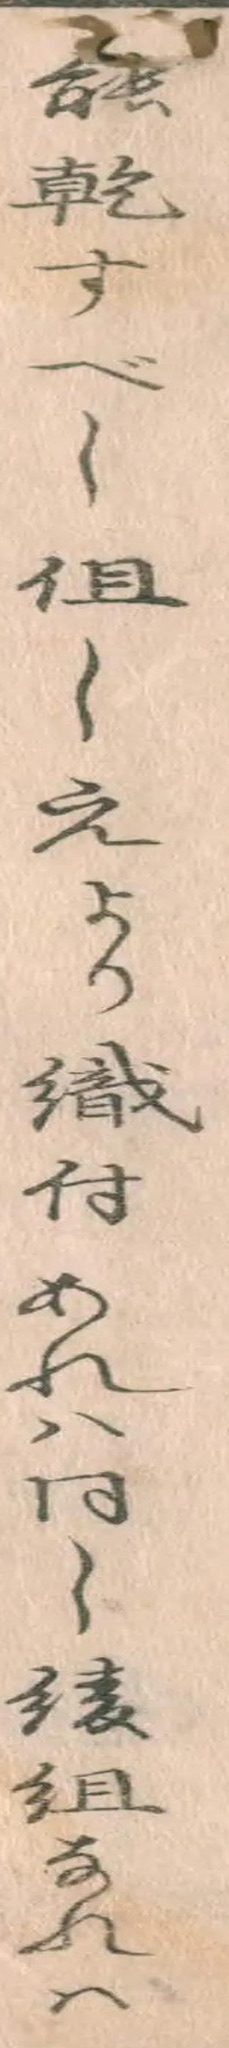能乾すべし但し元より織付あれは同し綾組なれは
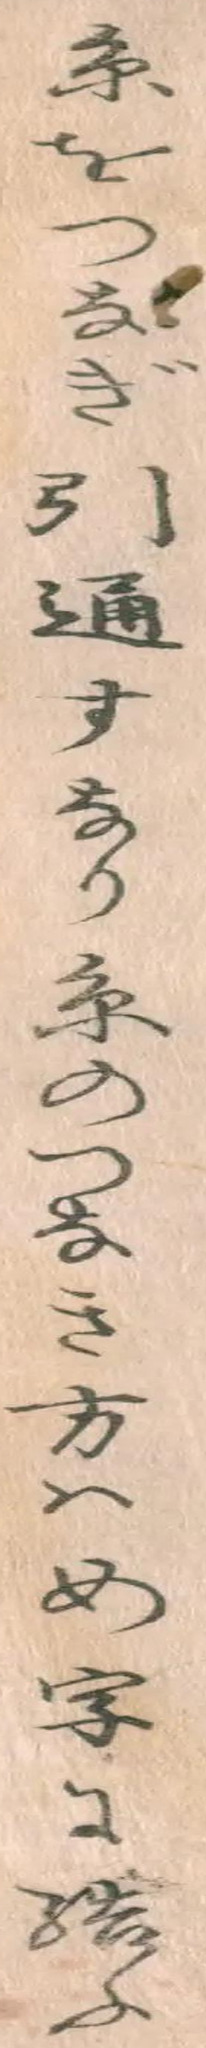糸をつなぎ引通すなり糸のつなき方はめ字に結ふ
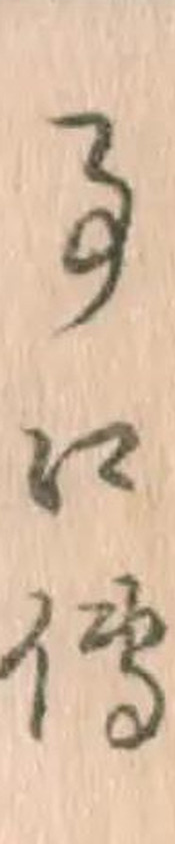事口伝
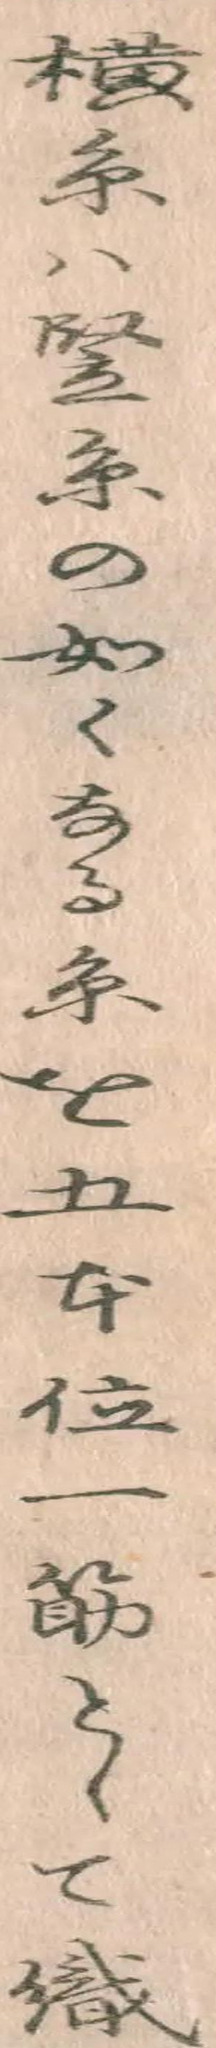一横糸は竪糸の如くなる糸を五本位一筋として織
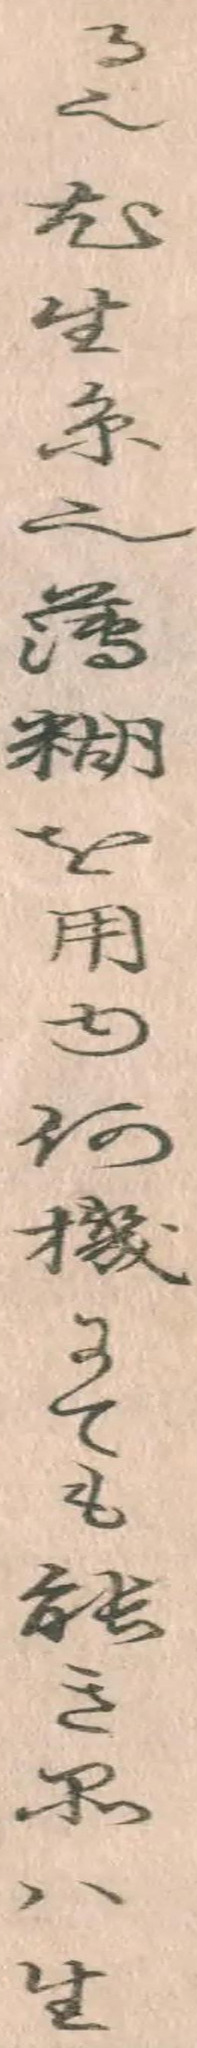る也尤生糸也薄糊を用ゆ何機にても能き品は生
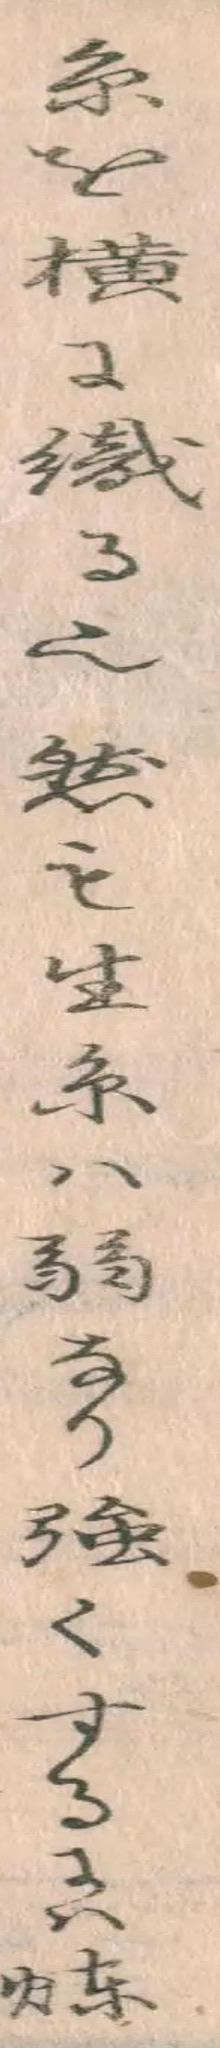糸を横に織る也然も生糸は弱なり強くするには煉
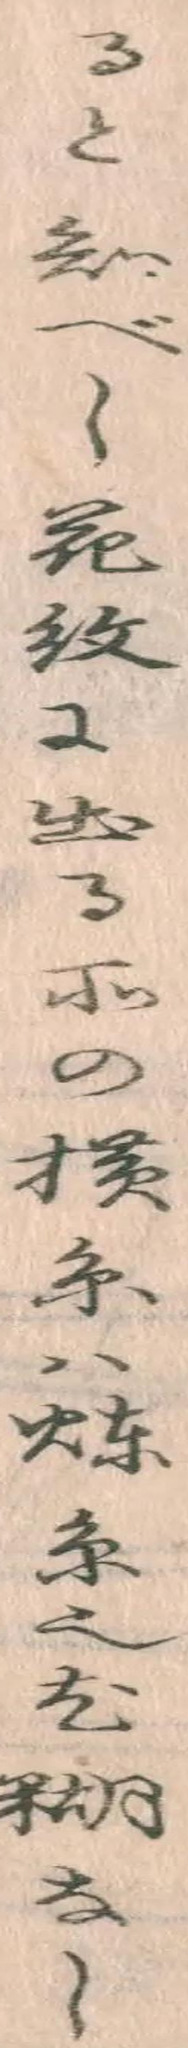ると知べし花紋に出る所の横糸は煉糸也尤糊なし
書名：機織彙編 5巻. [2]
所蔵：国立国会図書館 National Diet Library, JAPAN
